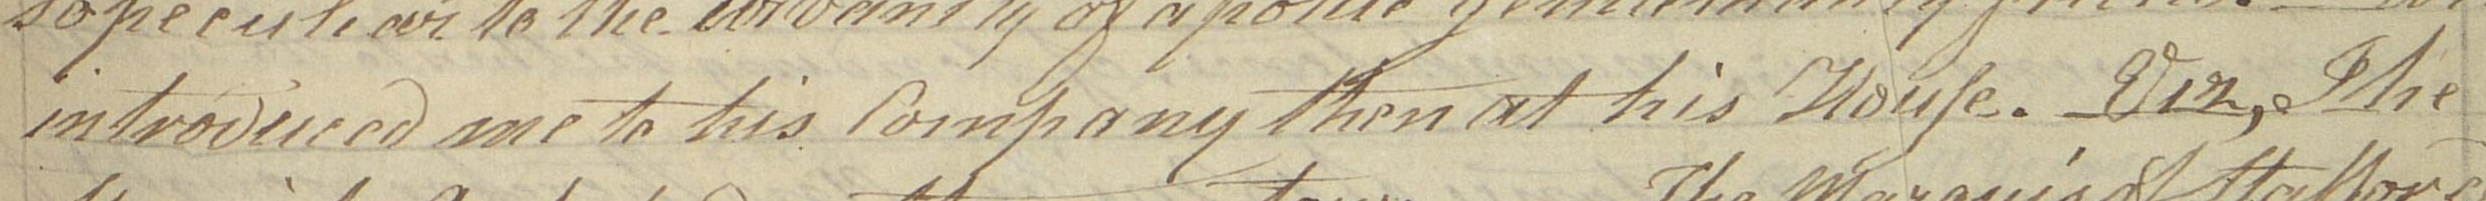introduced me to his Company then at his House. Viz, the
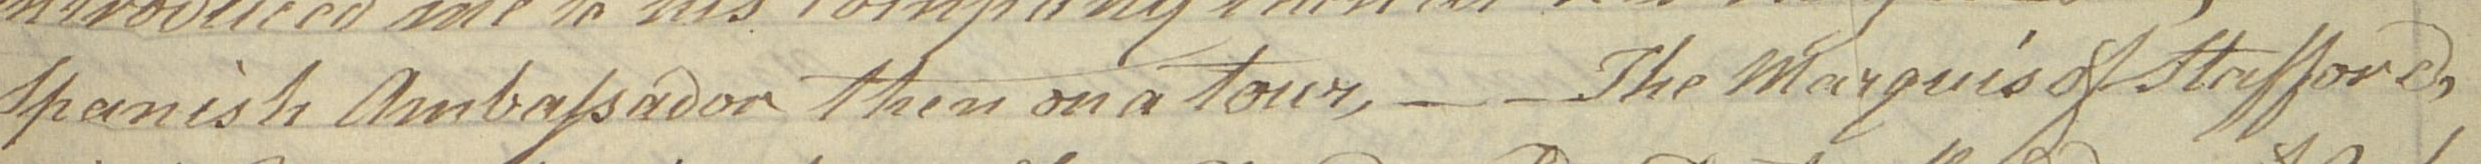Spanish Ambassador then on a tour, The Marquis of Stafford
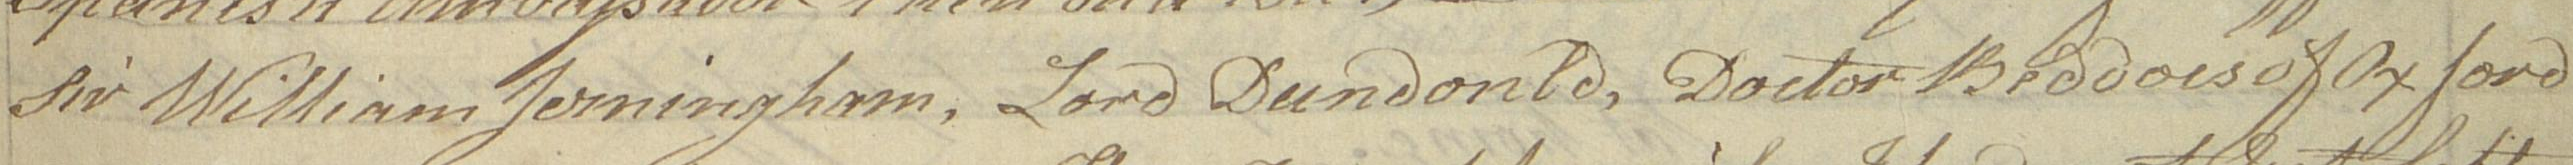Sir William Jerningham, Lord Dundonld, Doctor Beddois of Oxford
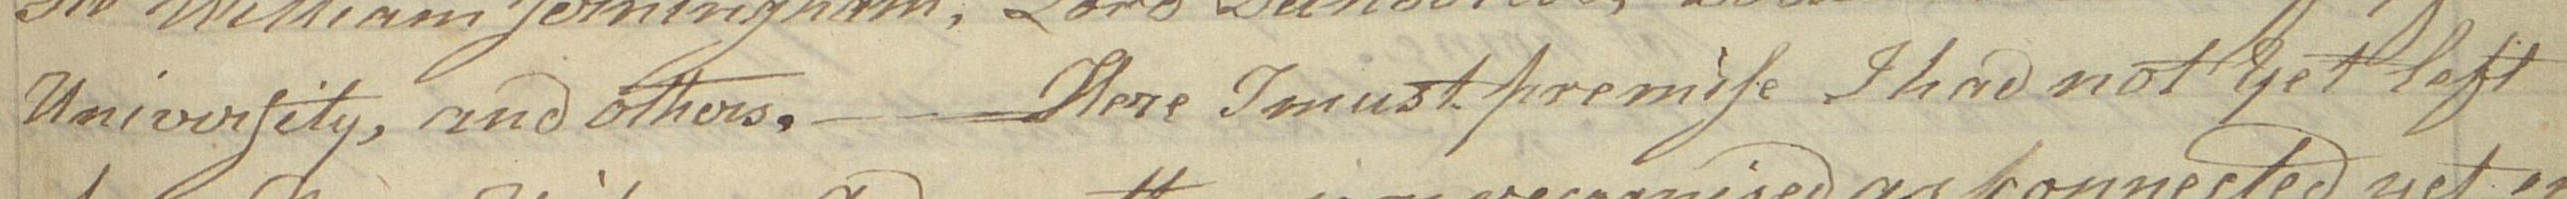University, and others. Here I must premise I had not yet left
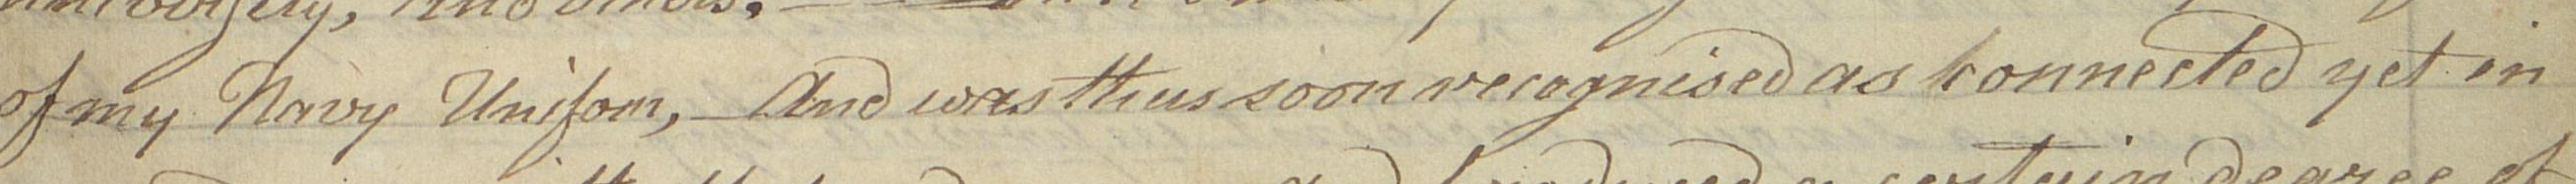of my Navy Unison, And was thus soon recognised as connected yet in
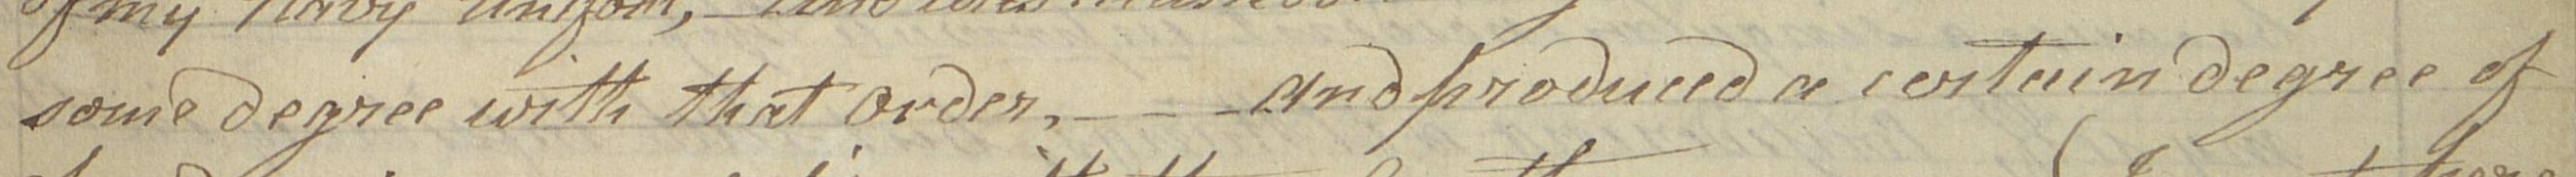some degree with that order, and produced a certain degree of
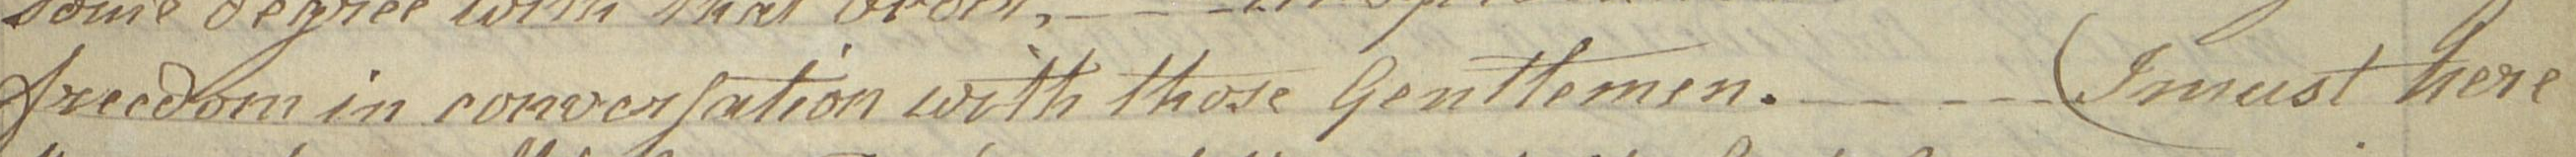freedom in conversation with those Gentlemen. (I must here
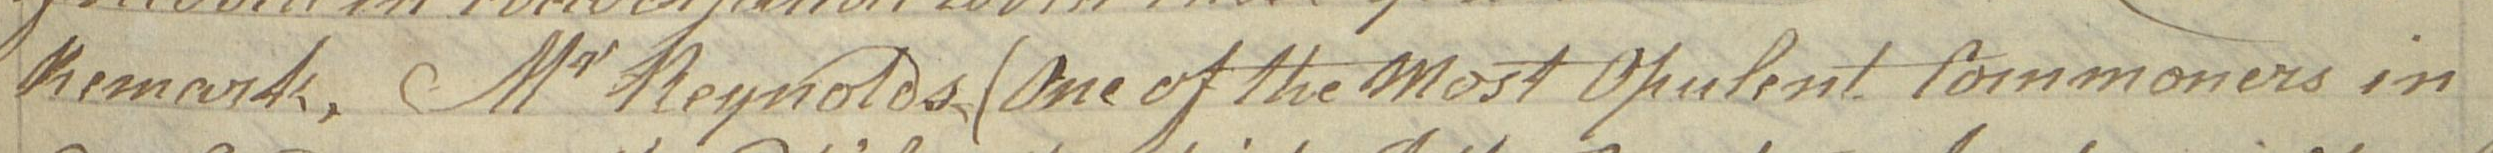Remark, M^r Reynolds (one of the Most Opulent Commoners in
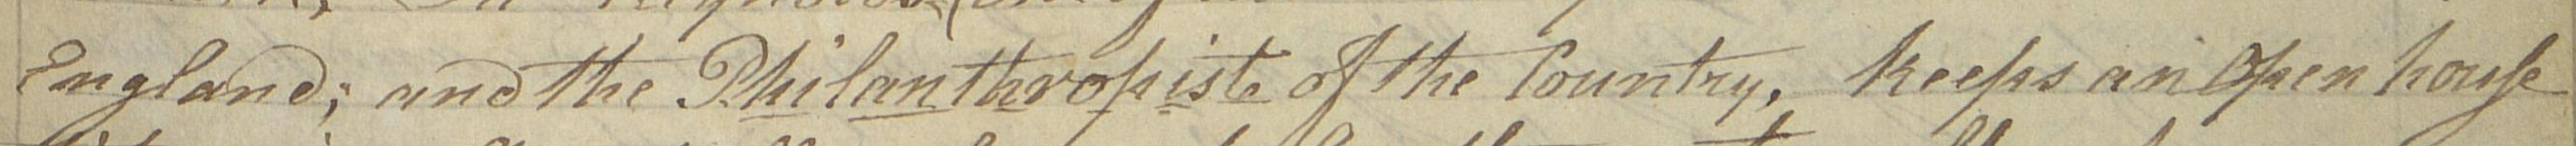England; and the Philanthropist of the Country, keeps an Open house
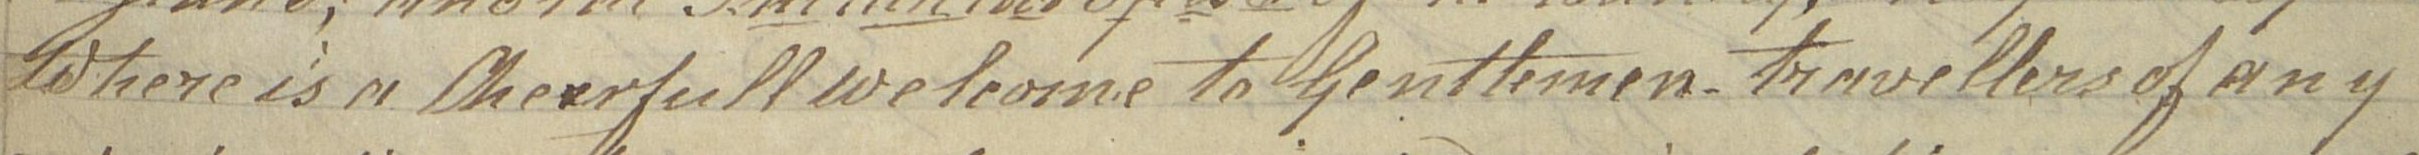where is a Chearfull Welcome to Gentlemen travellers of any
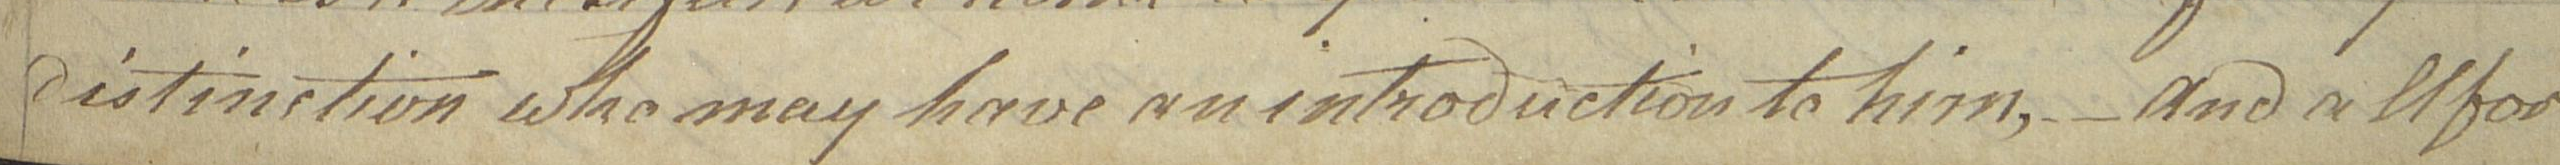distinction who may have an introduction to him, And all for
